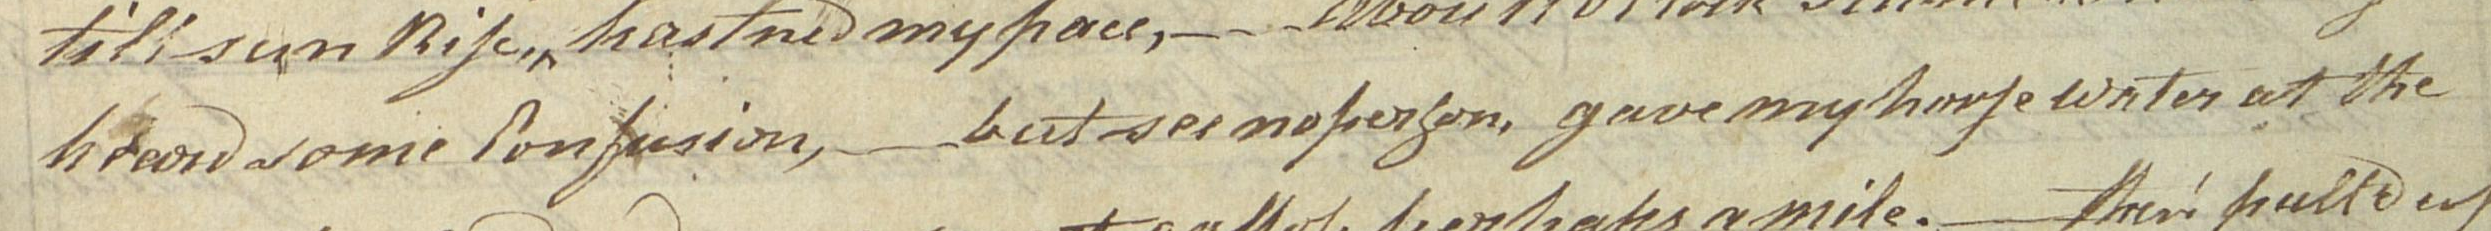heard some Confusion, but see no person, gave my horse water at the
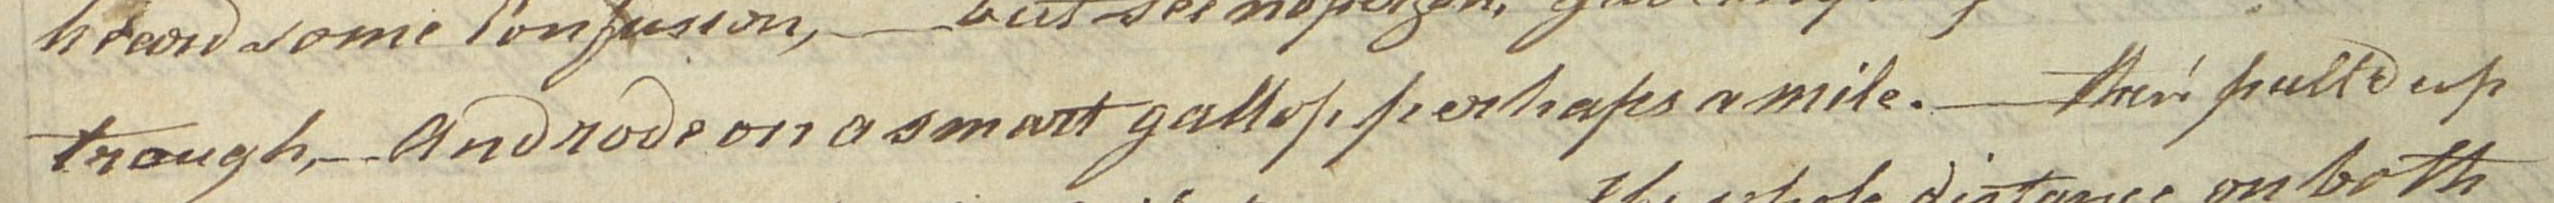trough, And rode on a smart gallop perhaps a mile. Then pull'd up
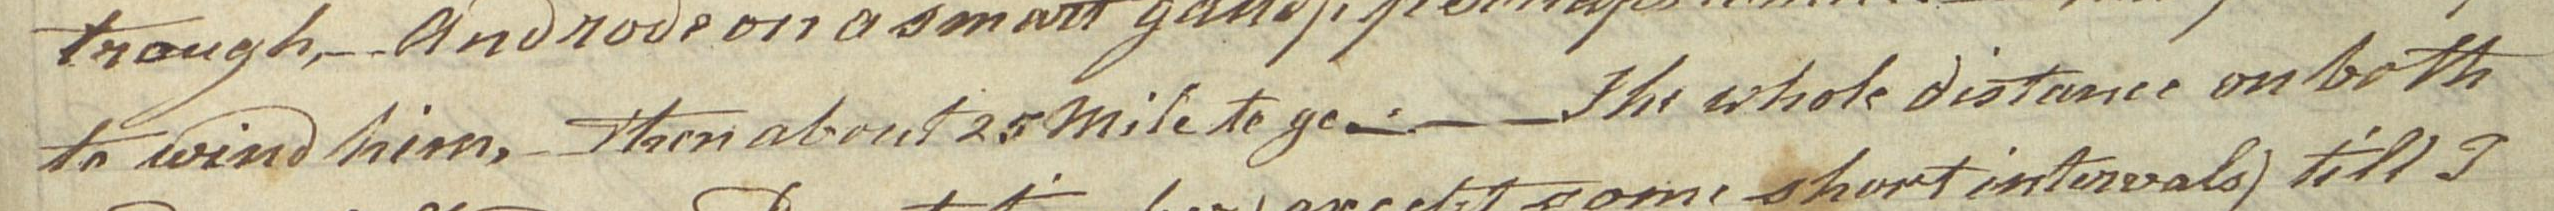to wind him, then about 20 mile to go. The whole distance on both
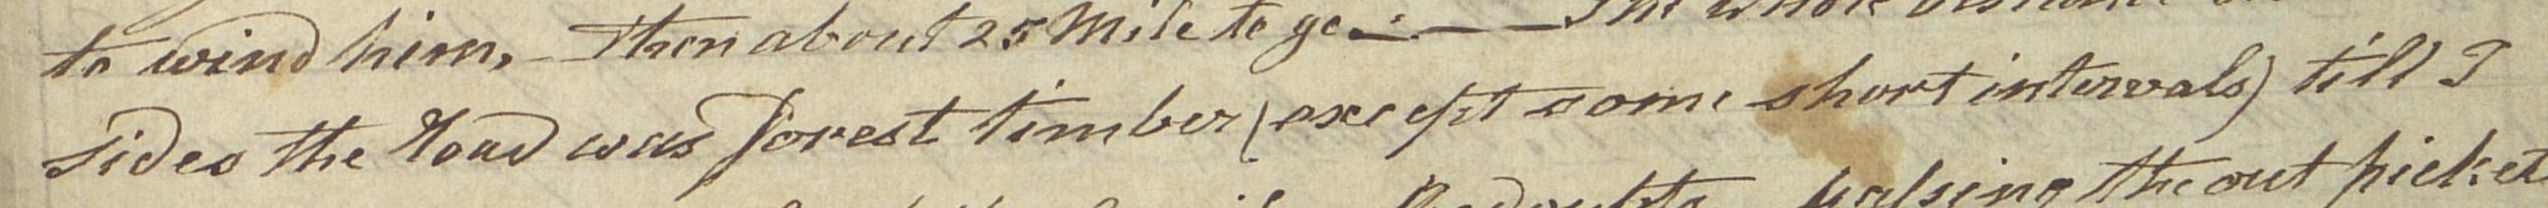sides the Road was forest timber (except some short intervals) tilI I
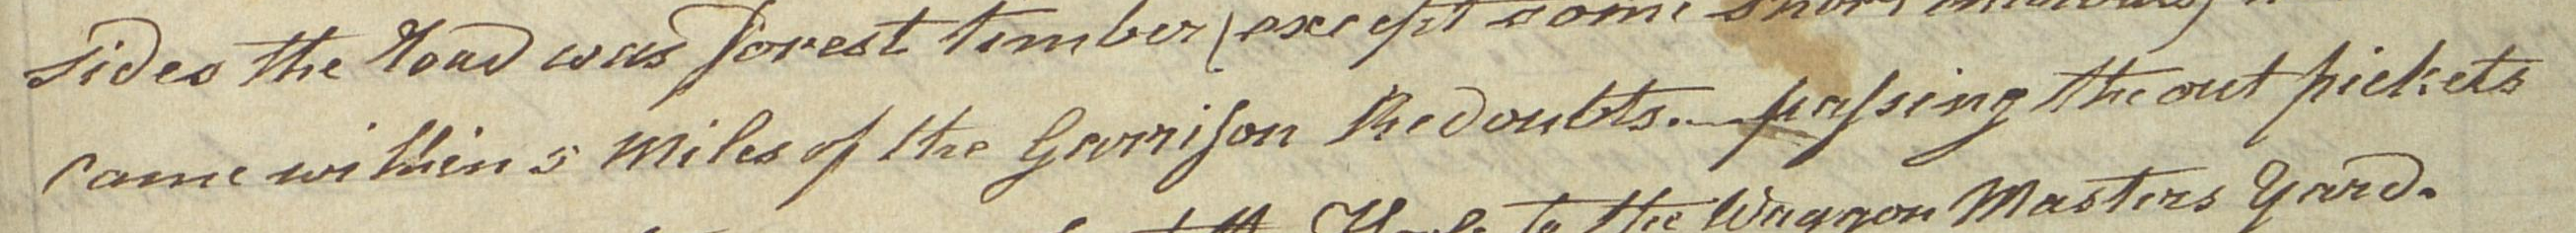come within 5 Miles of the Garrison Redoubts passing the out pickets
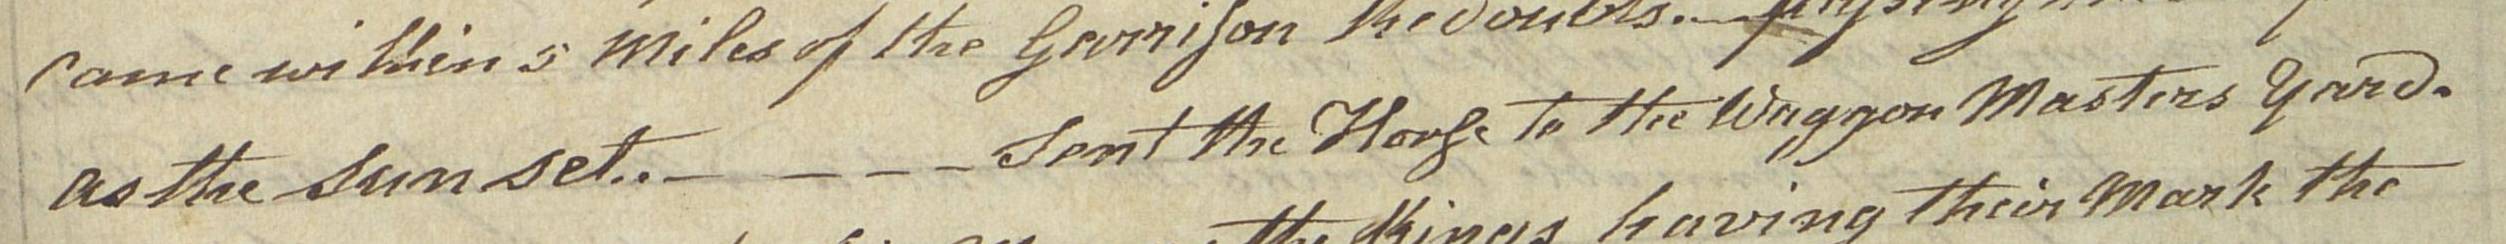as the sun set. Sent the Horse to the Waggon Masters Yard.
